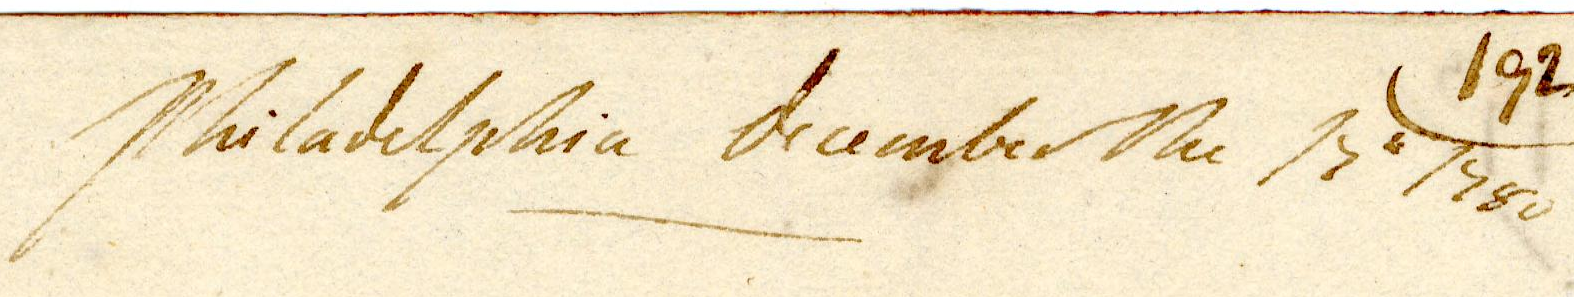Philadelphia December 17^th 1780
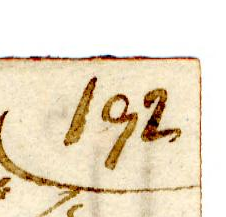192
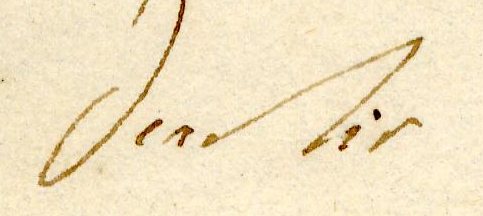Dear Sir
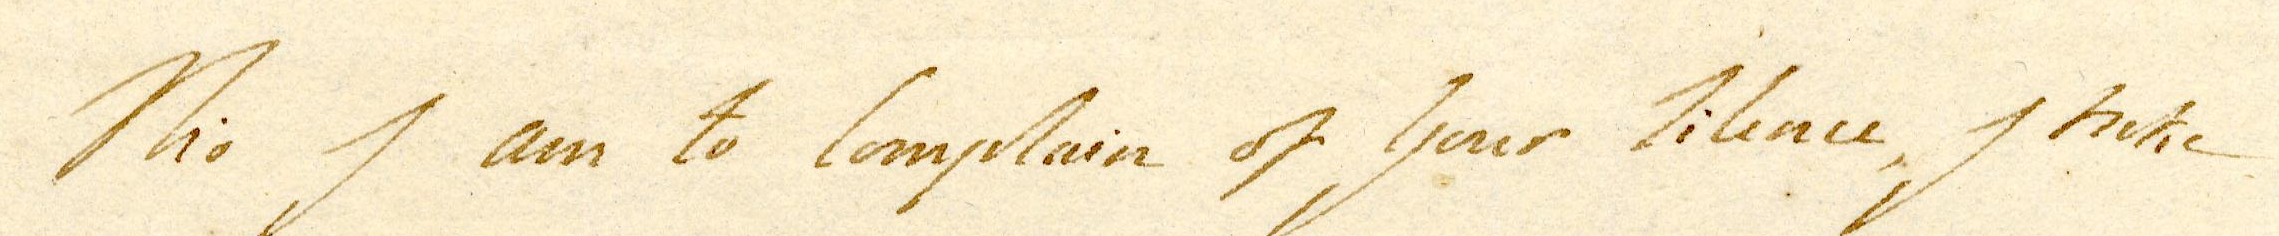Tho I am to Complain of your silence, I take
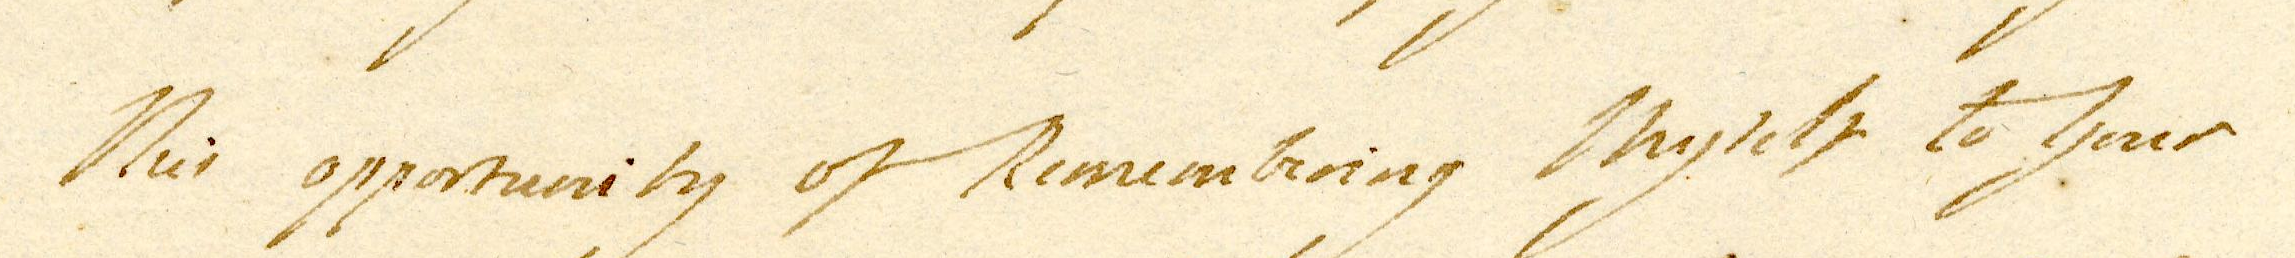this opportunity of Remembering myself to your
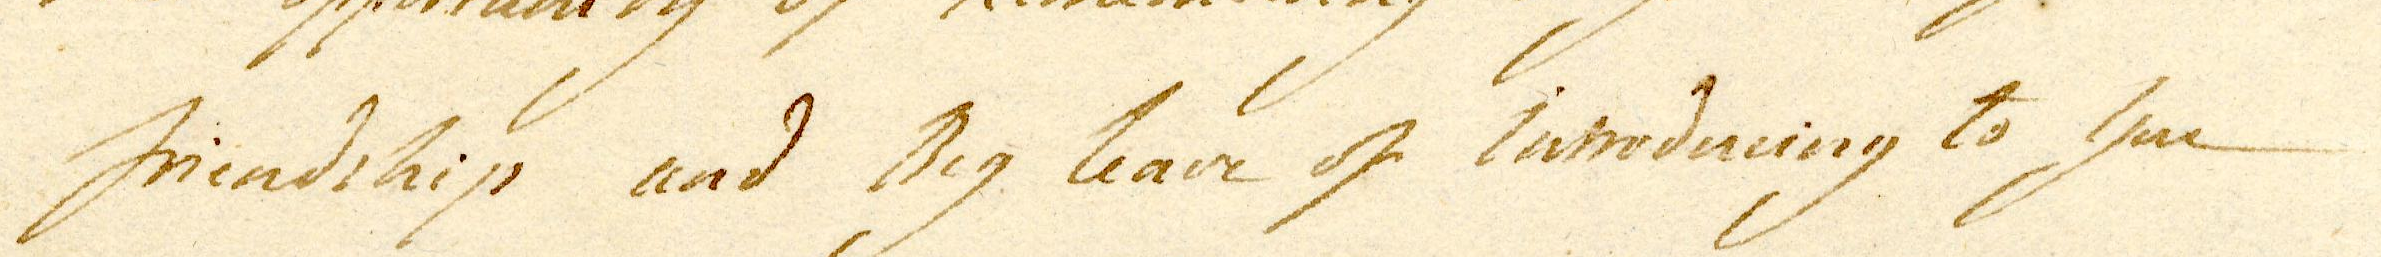friendship and Beg leave of introducing to you
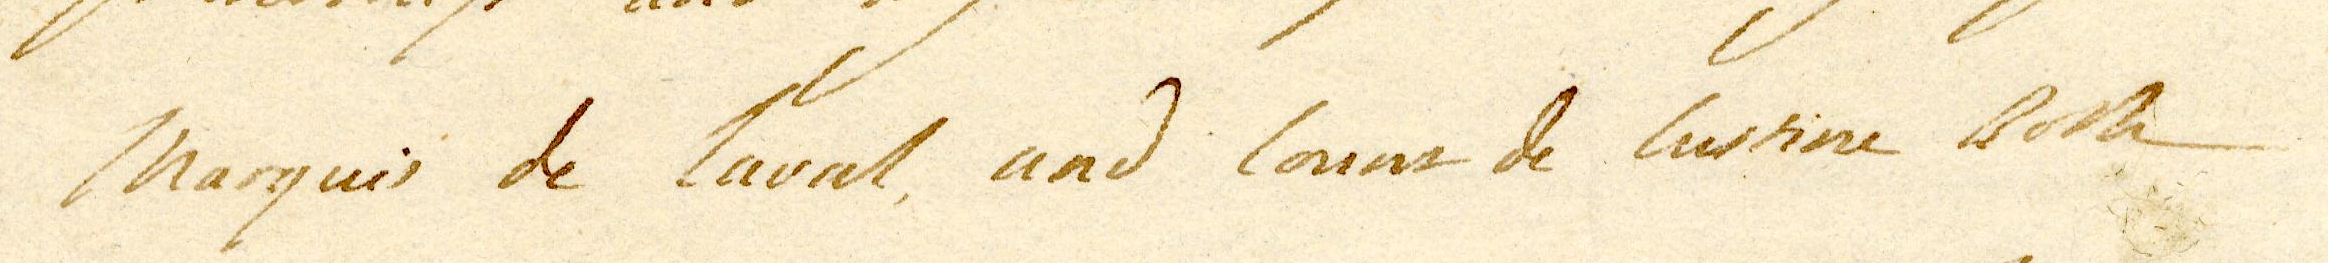Marquis de Laval and Court de Custine Roth
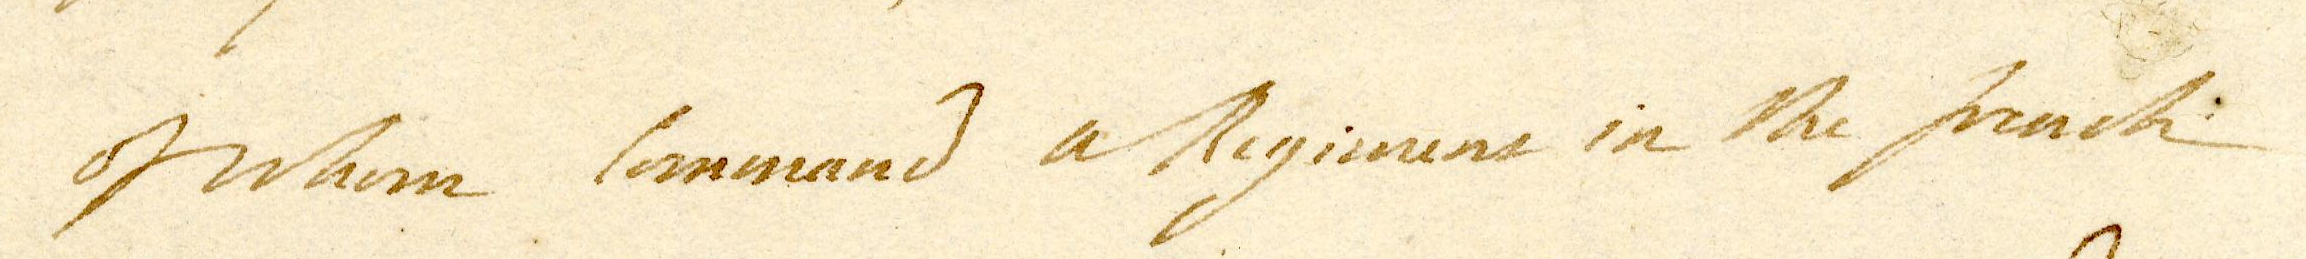of whom Command a Regiment in the French
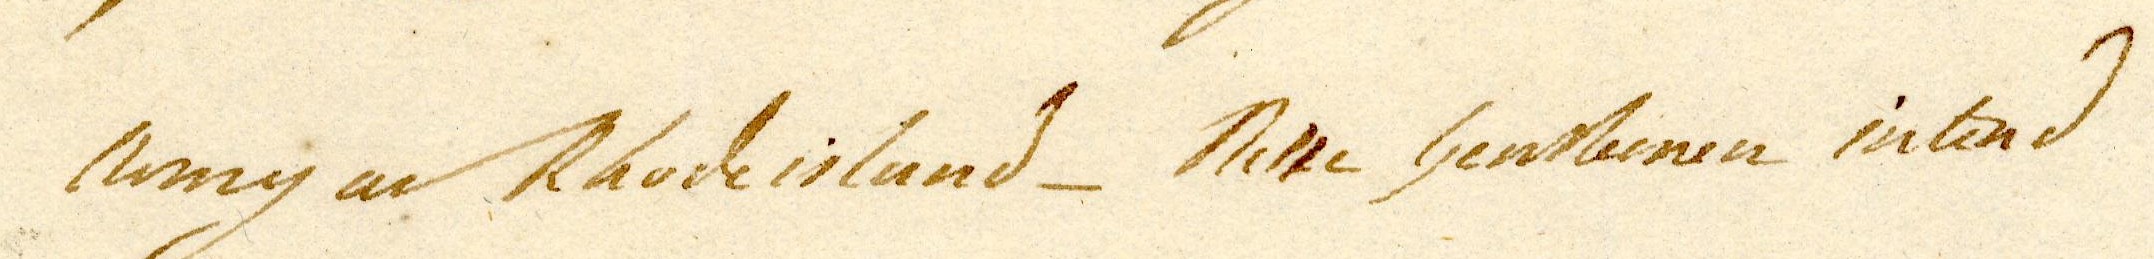Army at Rhode Island.- These Gentlemen intend
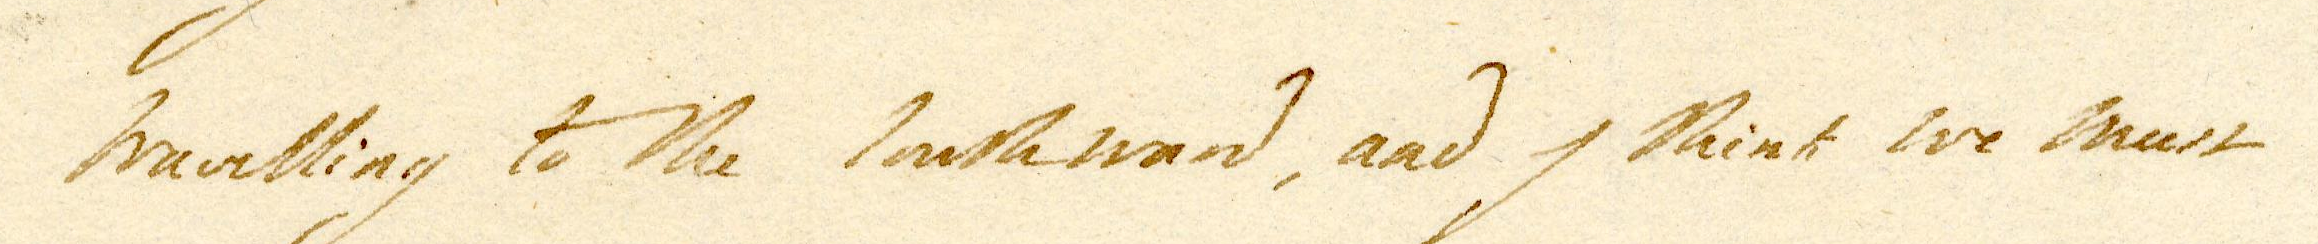travelling to the Southward and & think we must
